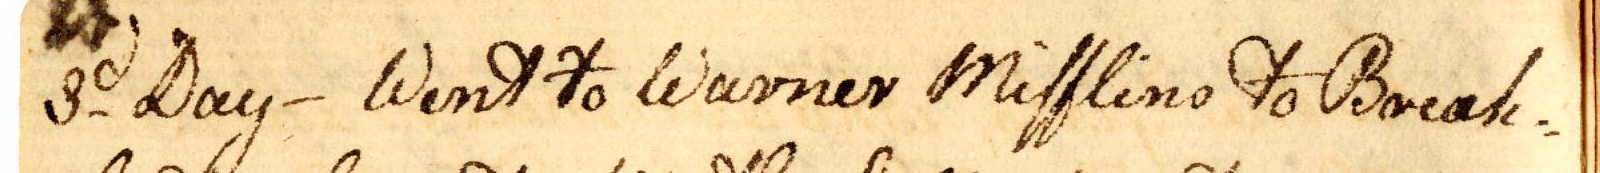3^d Day- Went to Warner Mifflins to Break-
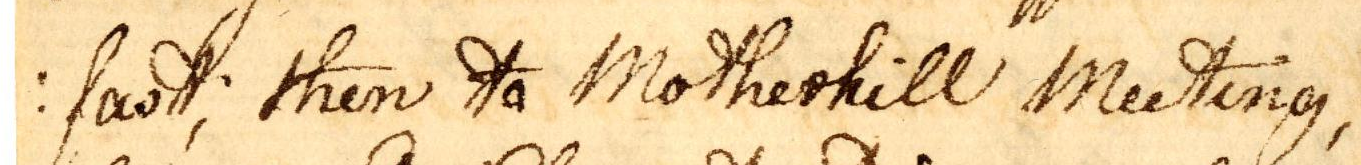-fast, then to Mothershill Meeting,
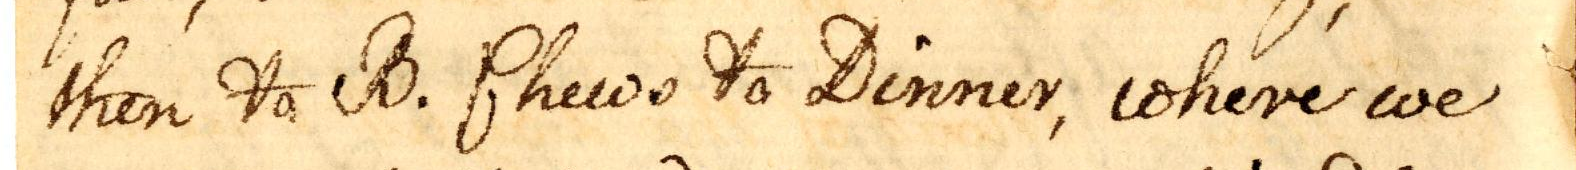then to B. Chews to Dinner, where we
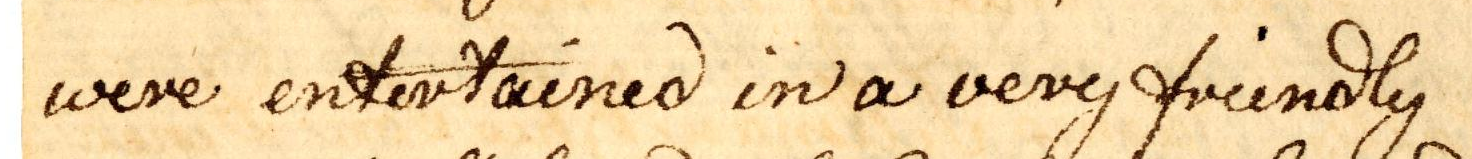were entertained in a very friendly
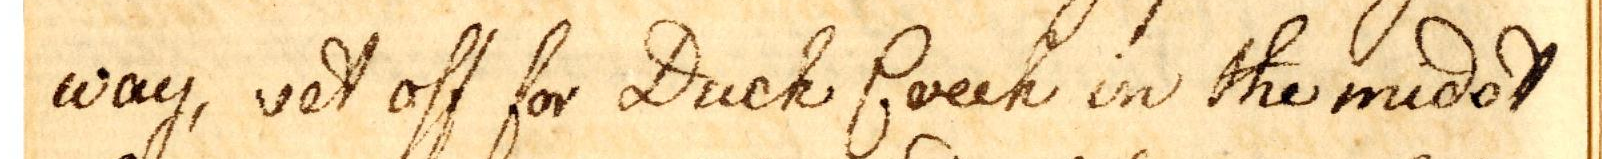way, set off for Duck Creek in the midst
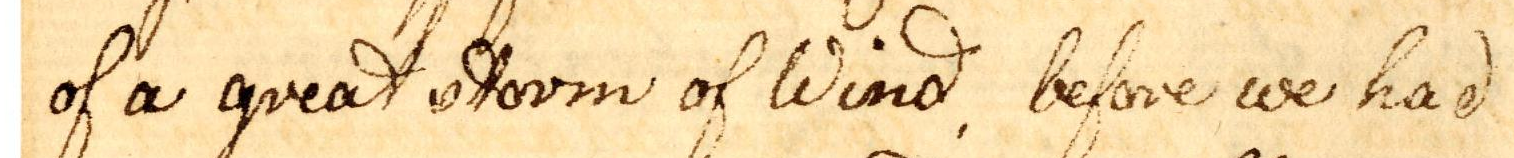of a great storm of Wind, before we had
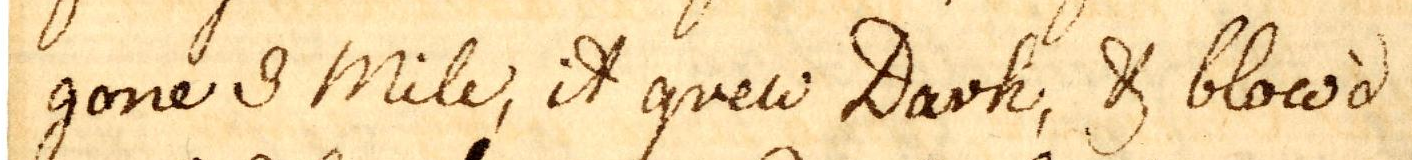gone 3 Mile, it grew Dark, & blow'd
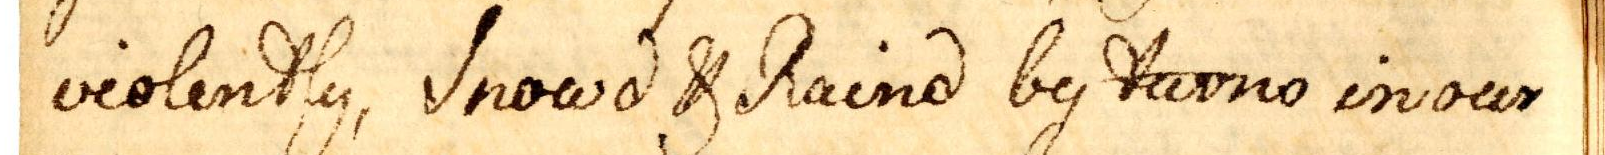violently, Snowd & Raind by turns in our
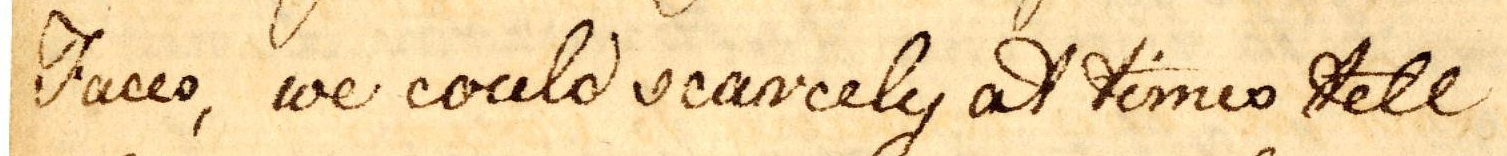Faces, we could scarcely at times tell
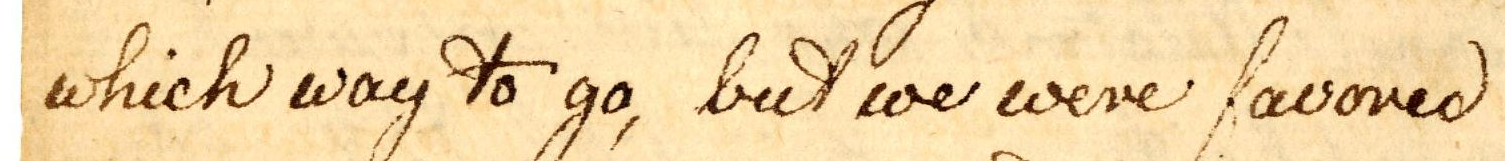which way to go, but we were favored
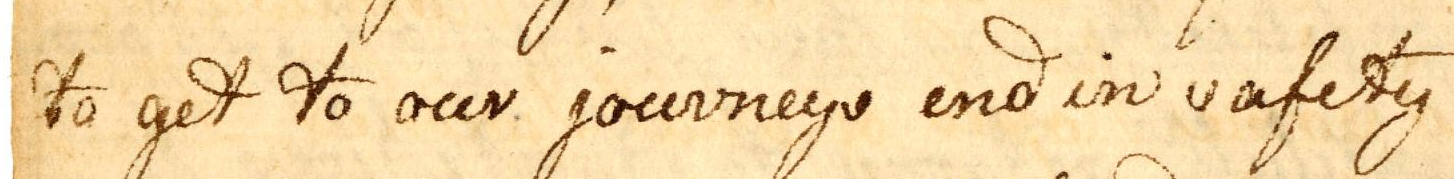to get to our journeys end in a safety
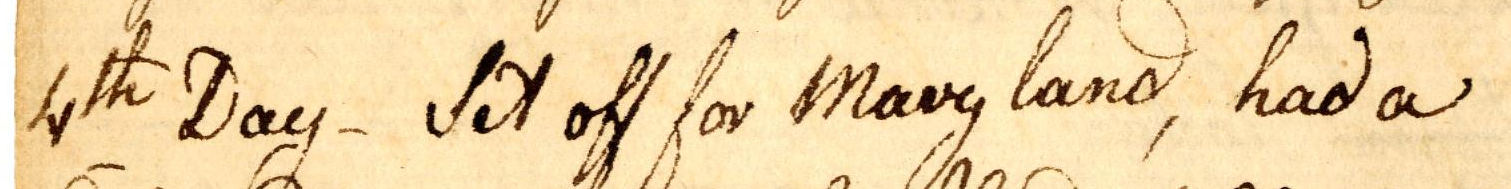4^th Day- Set off for Maryland, had a
